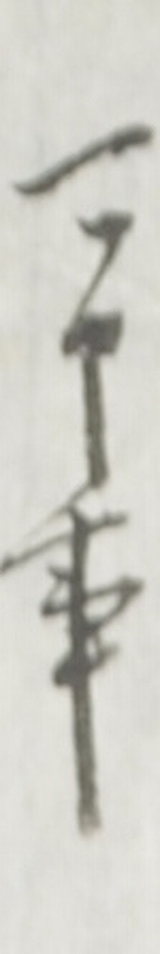可申渡
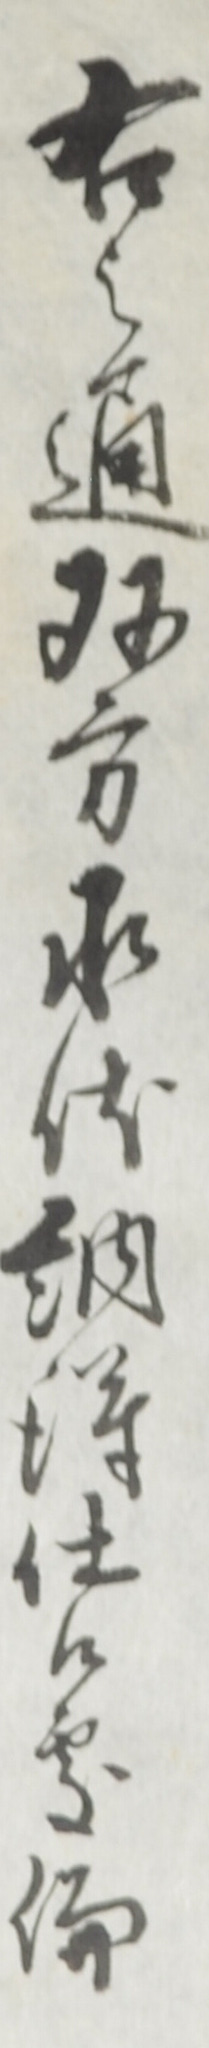右之通双方承伏納得仕候処偏
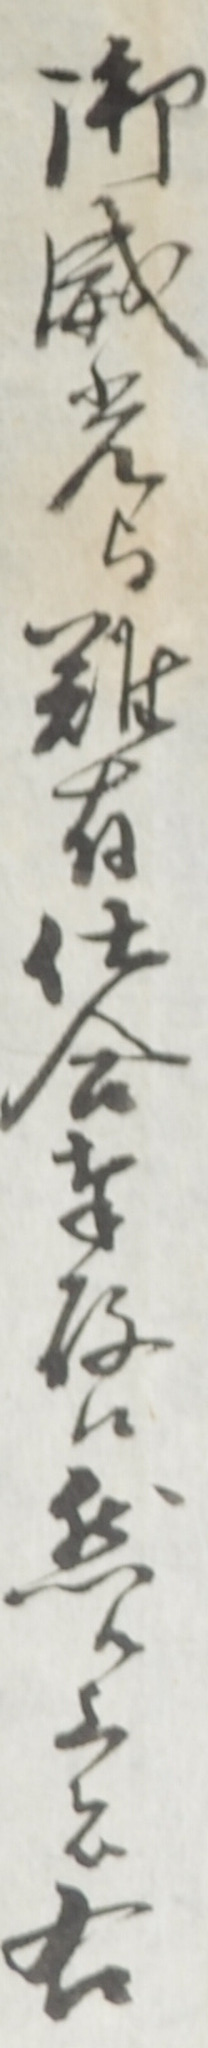御威光与難有仕合奉存候然ル上者右
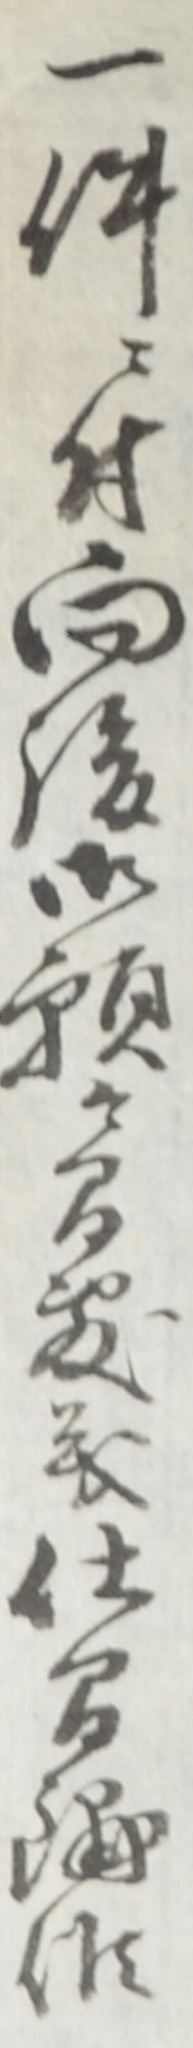一件ニ付向後御願ヶ間敷義仕間鋪候

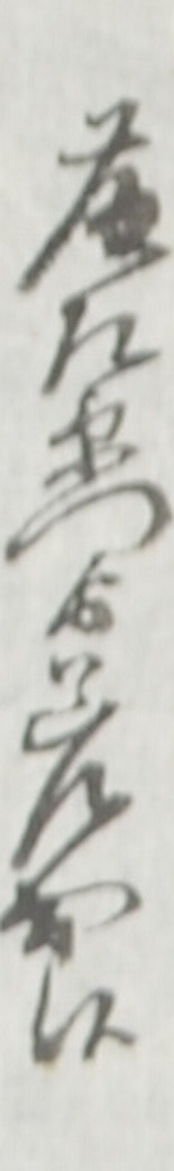藤左衛門ゟ差出候
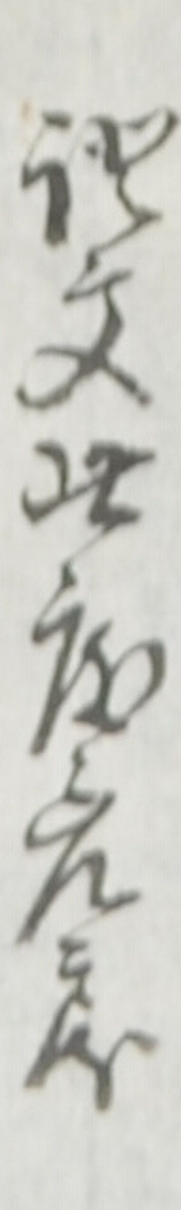証文此度差戻
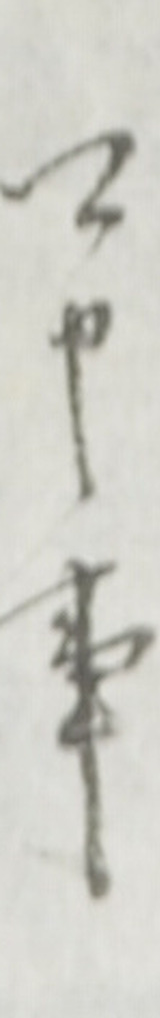可申渡
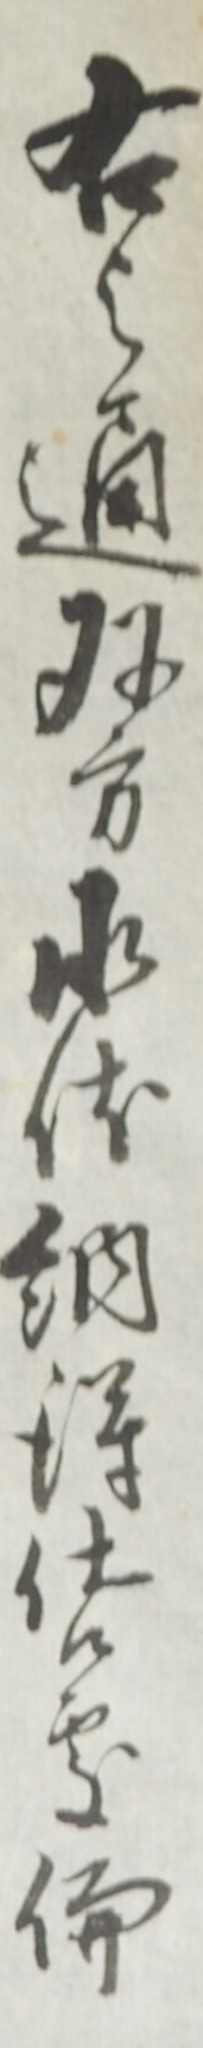右之通双方承伏納得仕候処偏
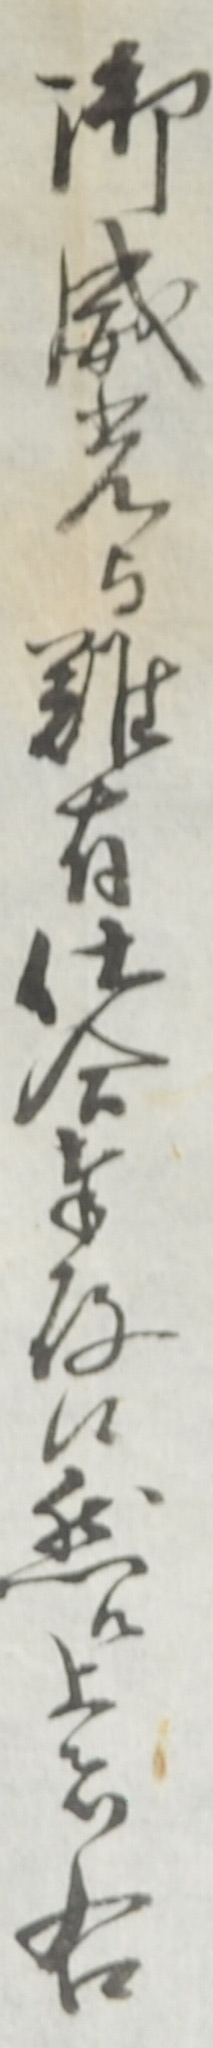御威光与難有仕合奉存候然ル上者右
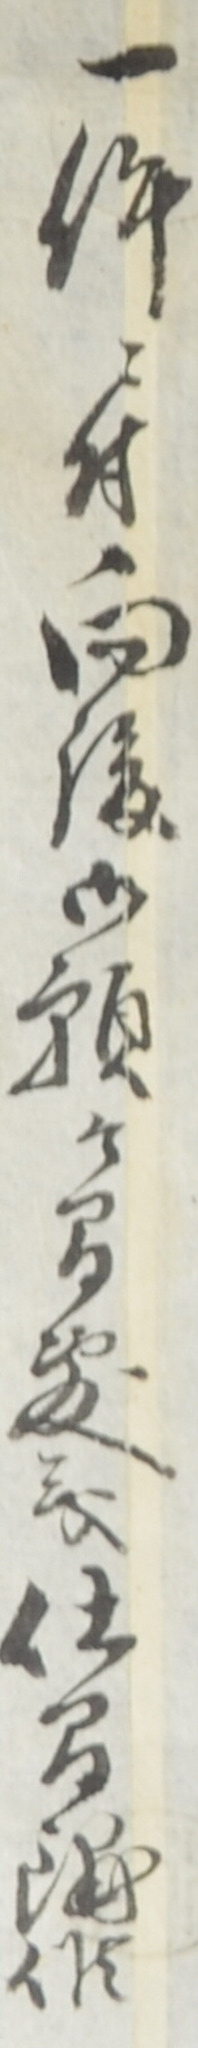一件ニ付向後御願ヶ間敷義仕間鋪候

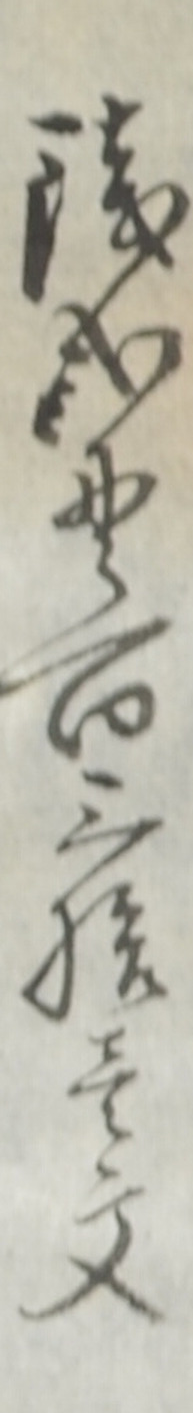銭弐貫百三拾壱文
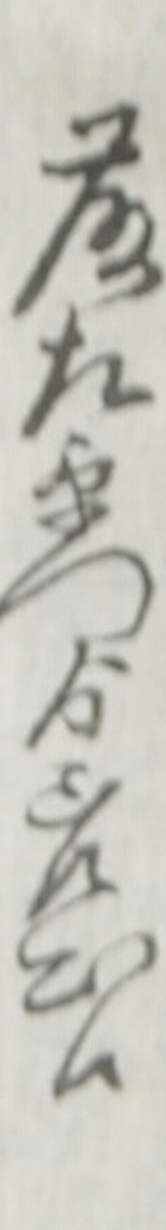藤左衛門ゟ差出候
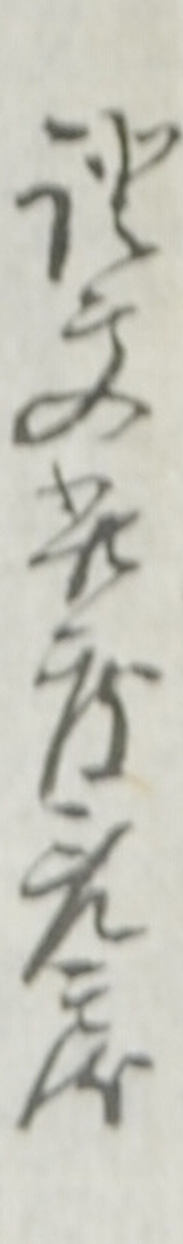証文此度差戻
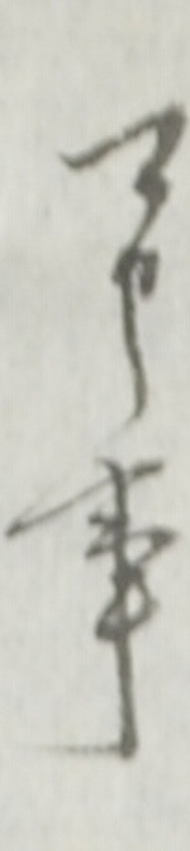可申事
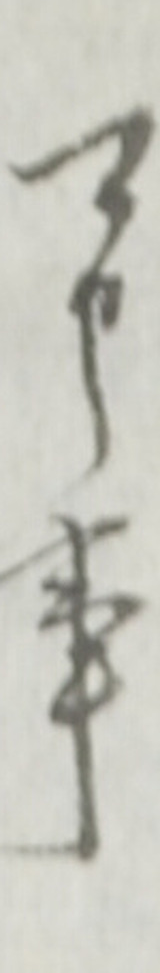可申事
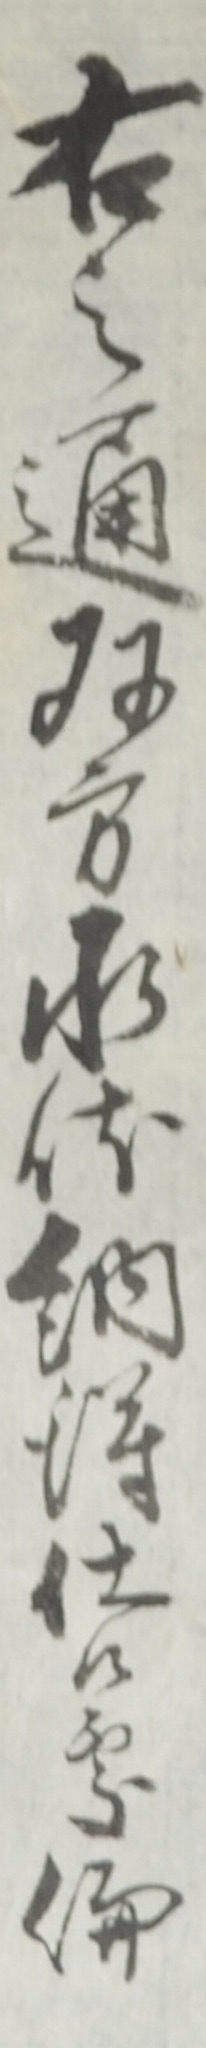右之通双方承伏納得仕候処偏
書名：（済口証文断簡）
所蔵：伊那市立高遠町図書館・合同会社AMANE
